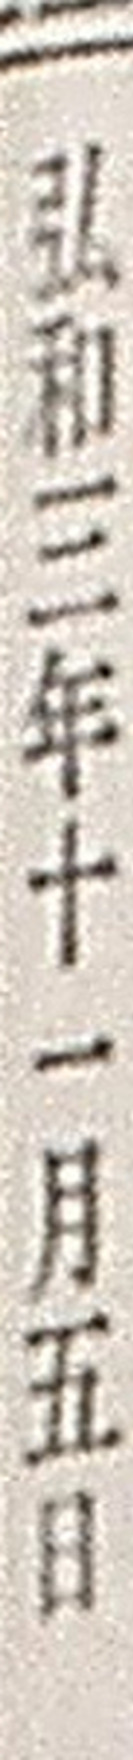弘和三年十一月五日
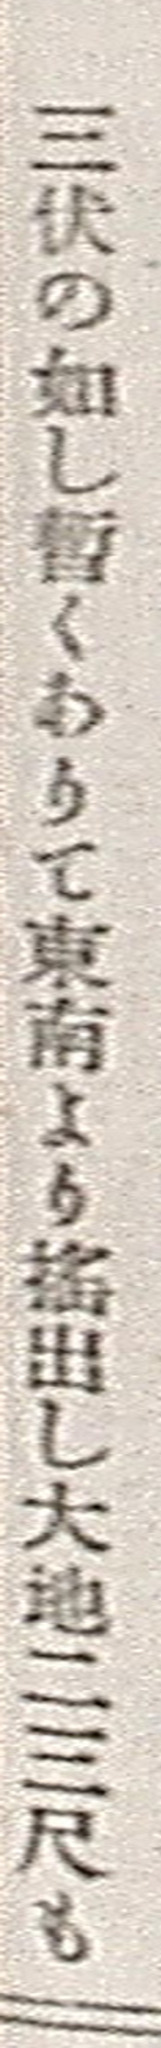三伏の如し暫くありて東南より揺出し大地二三尺も
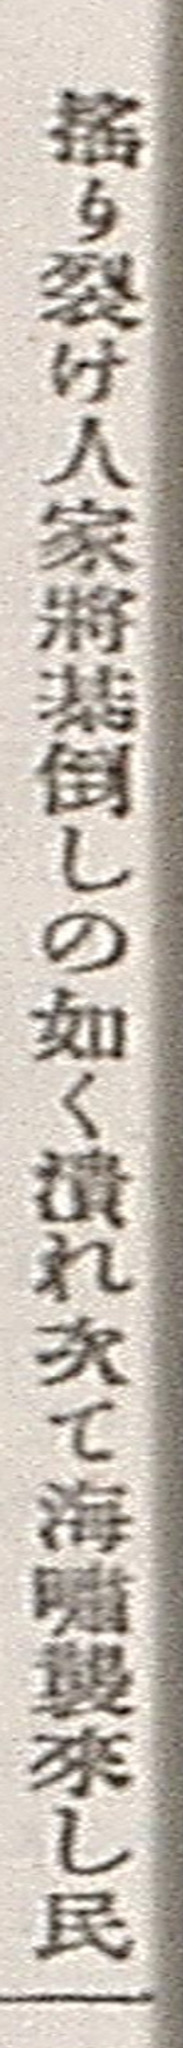揺り裂け人家将棋倒しの如く潰れ次で海嘯襲来し民
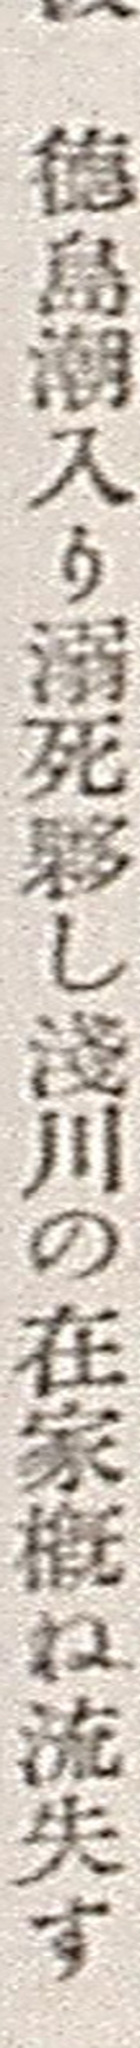阿波徳島潮入り溺死夥し浅川の在家概ね流失す
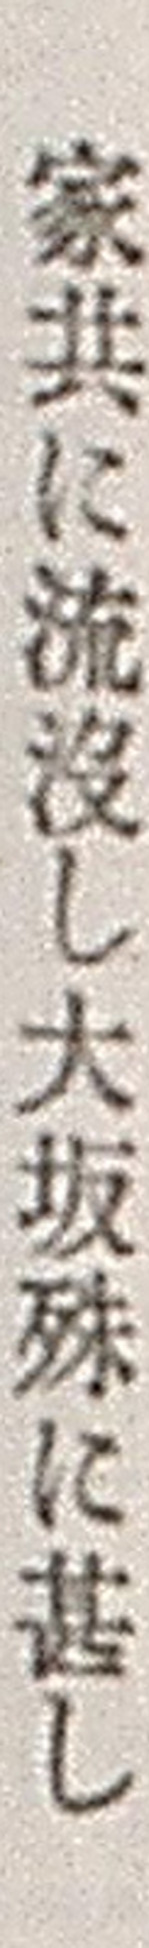家共に流没し大坂殊に甚し
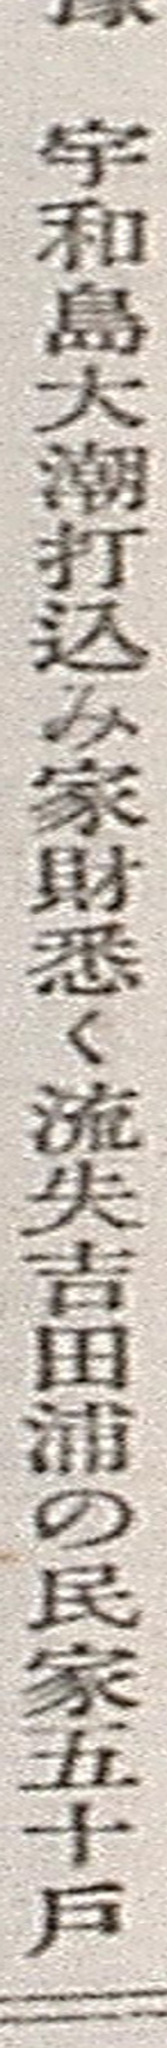伊予宇和島大潮打込み家財悉く流失吉田浦の民家五十戸
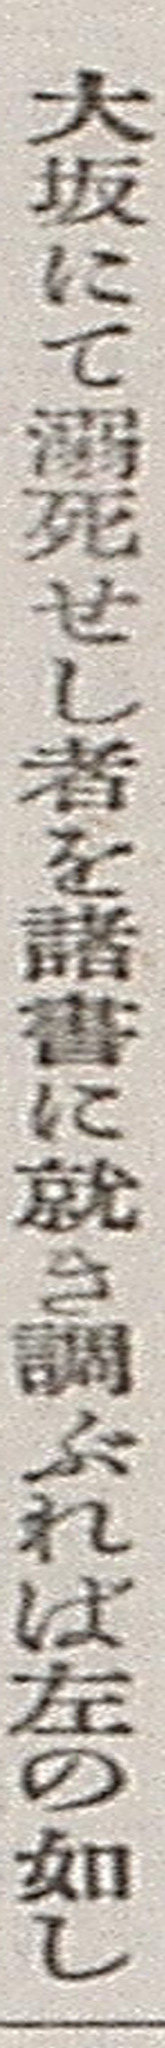大坂にて溺死せし者を諸書に就き調ぶれば左の如し
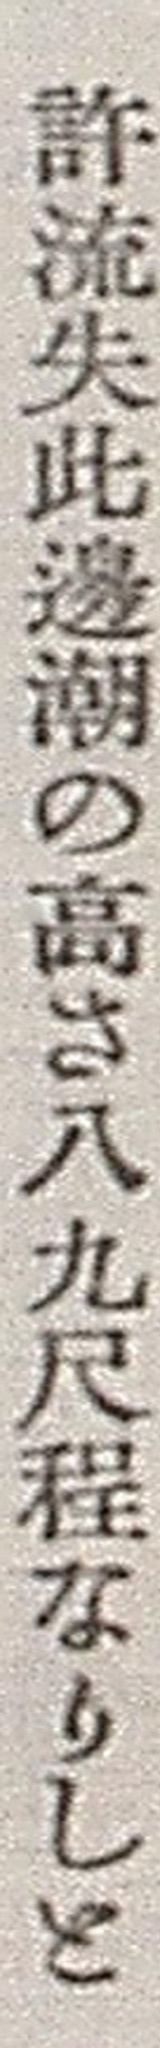許流失此辺潮の高さ八九尺程なりしと
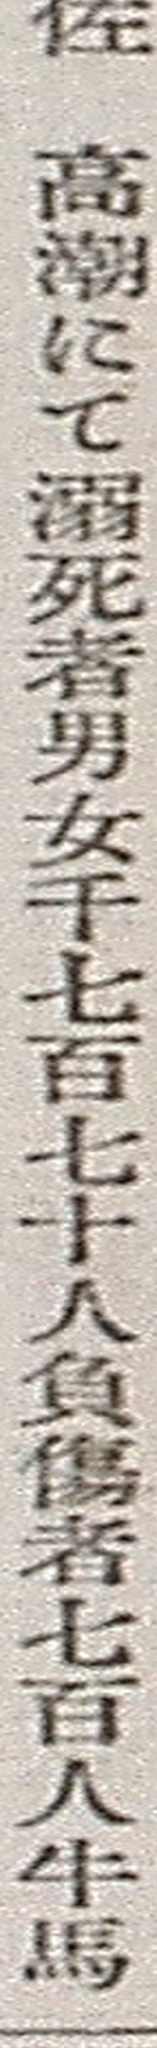土佐高潮にて溺死者男女千七百七十人負傷者七百人牛馬
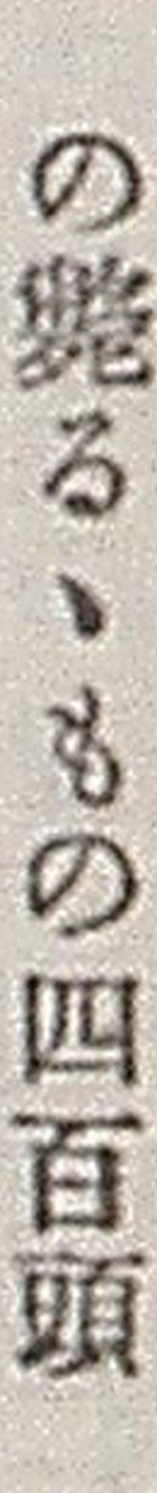の斃るゝもの四百頭
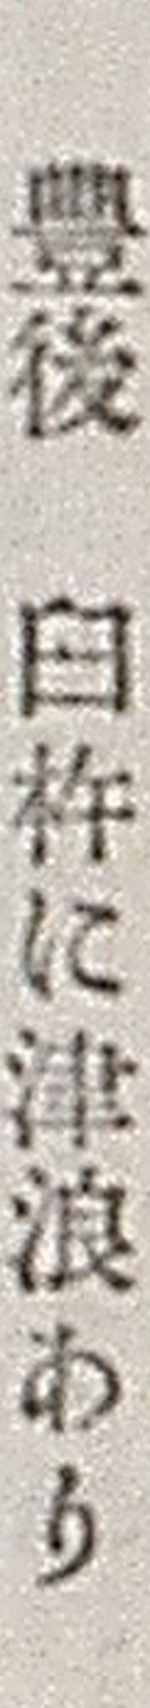豊後臼杵に津浪あり
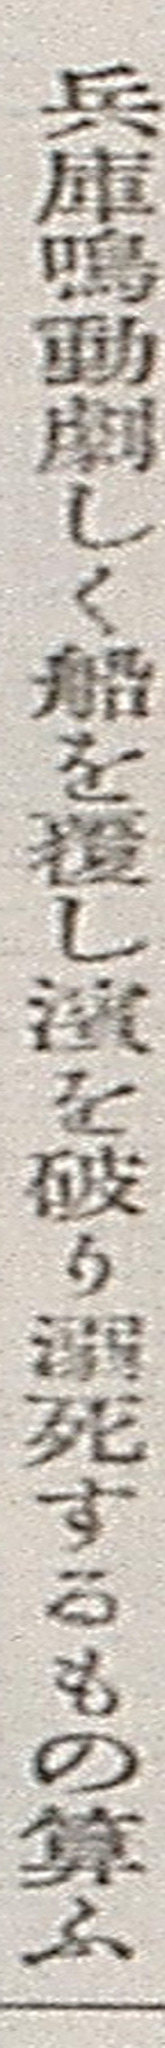兵庫鳴動劇しく船を覆し浜を破り溺死するもの算ふ
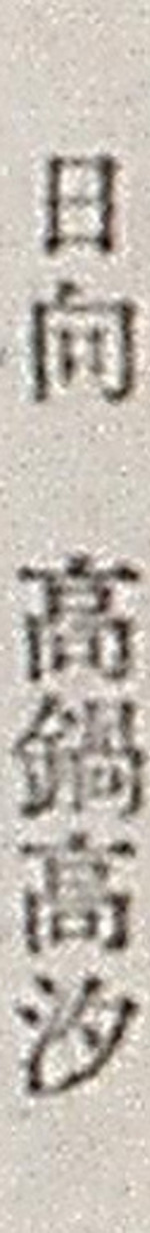日向高鍋高汐
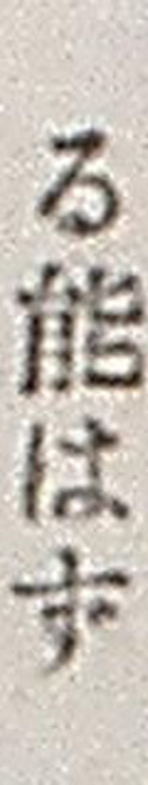る能はず
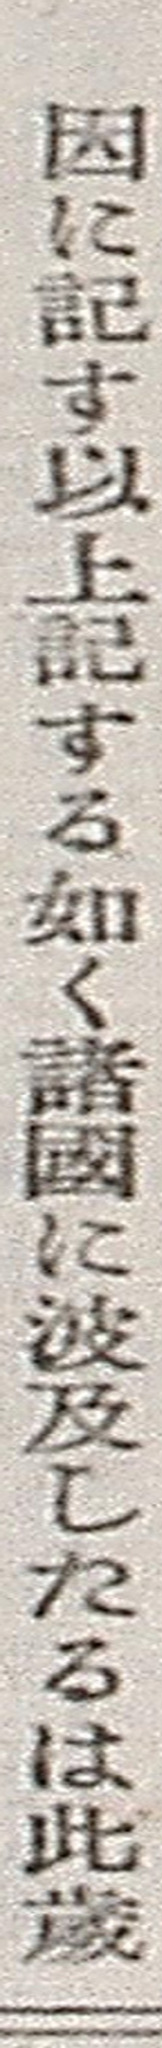因に記す以上記する如く諸国に波及したるは此歳
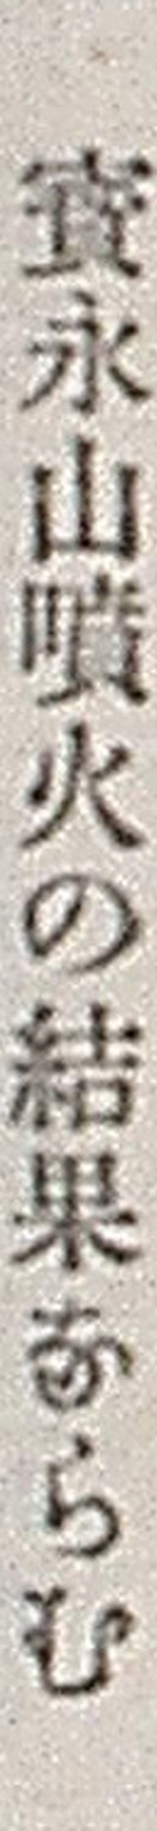寛永山噴火の結果ならむ
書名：風俗畫報臨時増刊第百二十號　大海嘯被害録（下）
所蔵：東京大学地震研究所図書室 Earthquake Research Institute Library, The University of Tokyo, JAPAN
